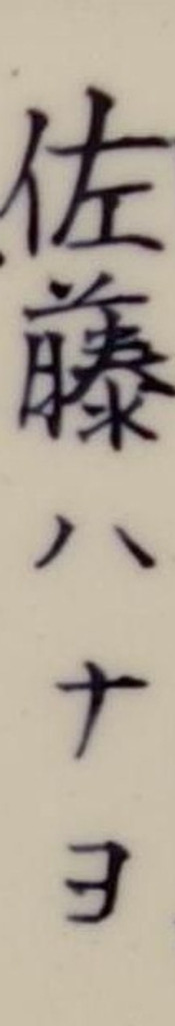佐藤ハナヨ
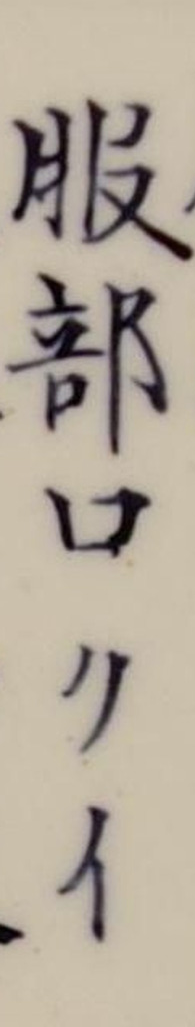服部ロクイ
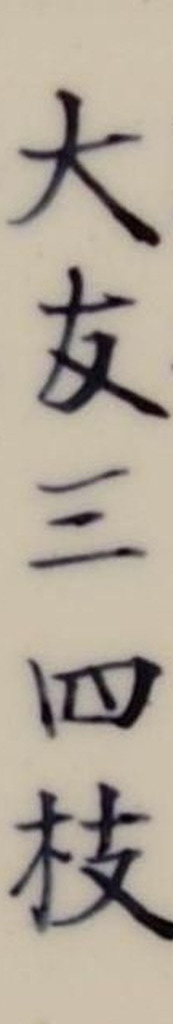大友三四枝
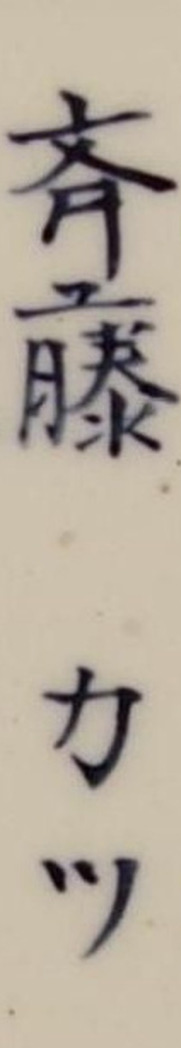斉藤カツ
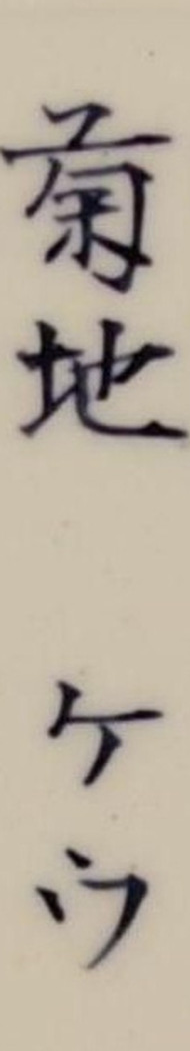菊地ケウ
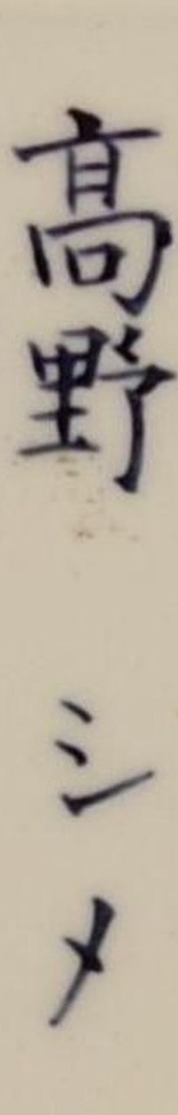高野シメ
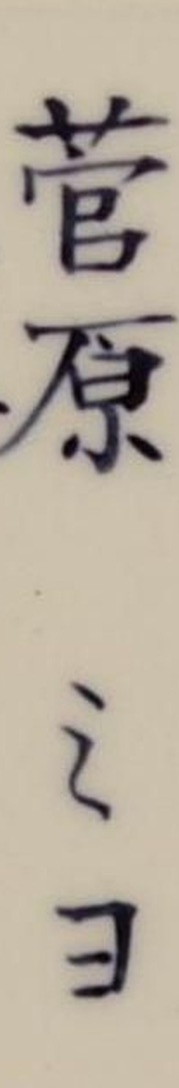菅原ミヨ
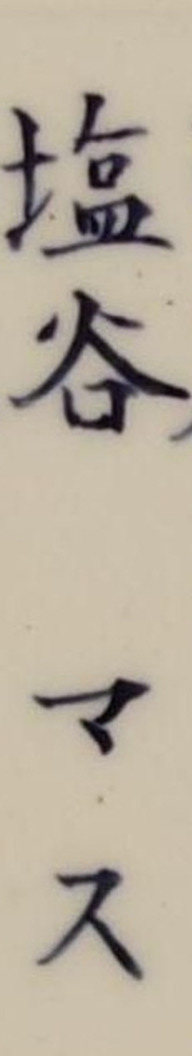塩谷マス
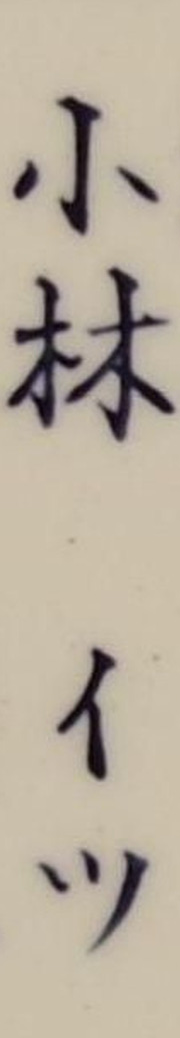小林イツ
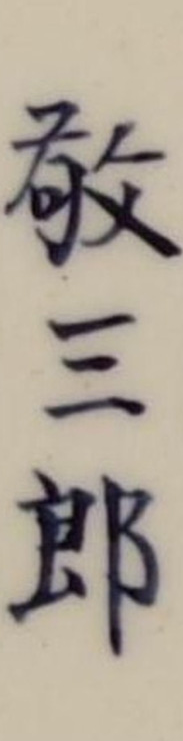敬三郎
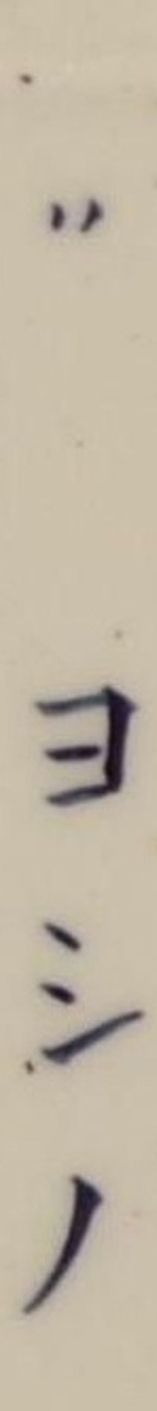ヨシノ
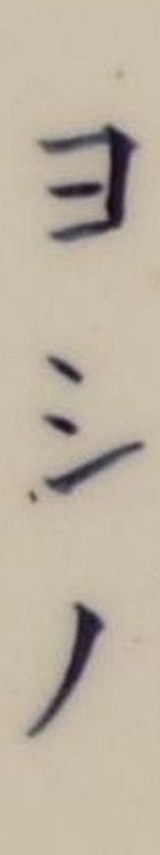ヨシノ
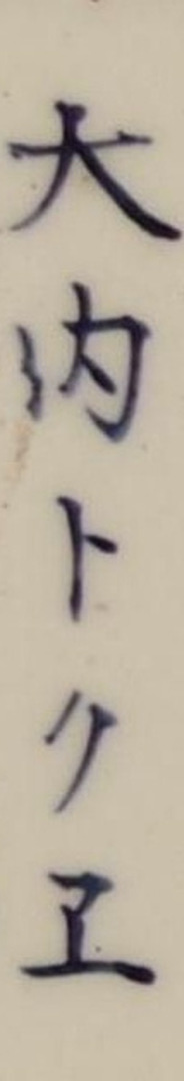大内トクエ
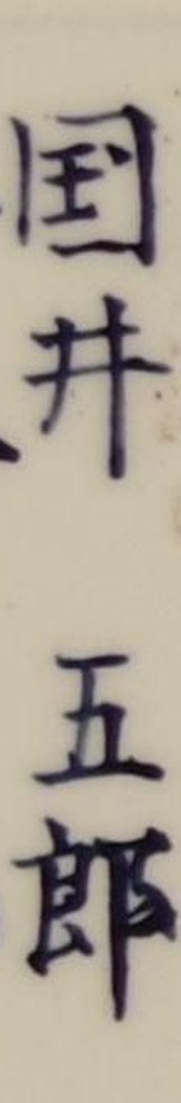国井五郎
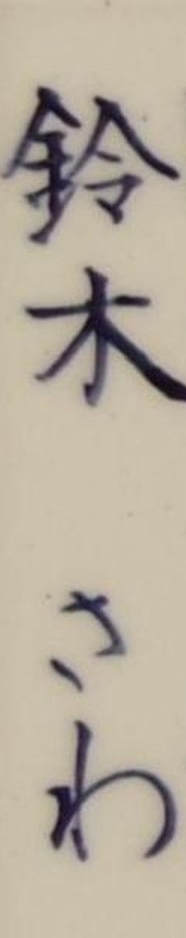鈴木さわ

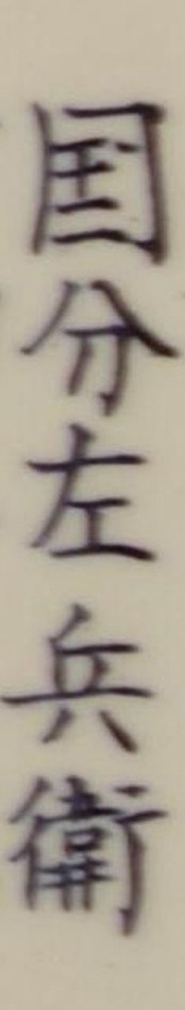国分左兵衛
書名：E~L
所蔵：高野山金剛峯寺
